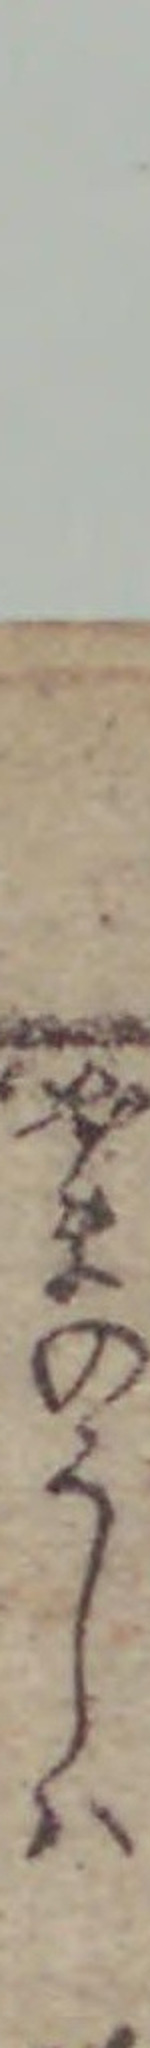やまのうしは
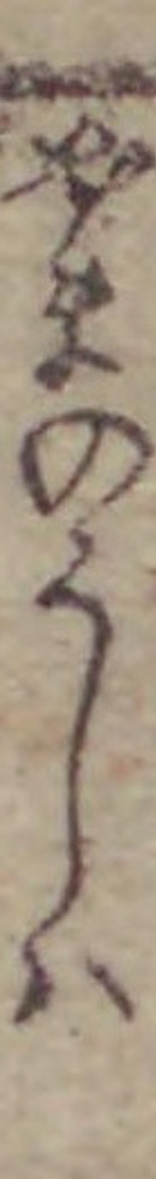やまのうしは
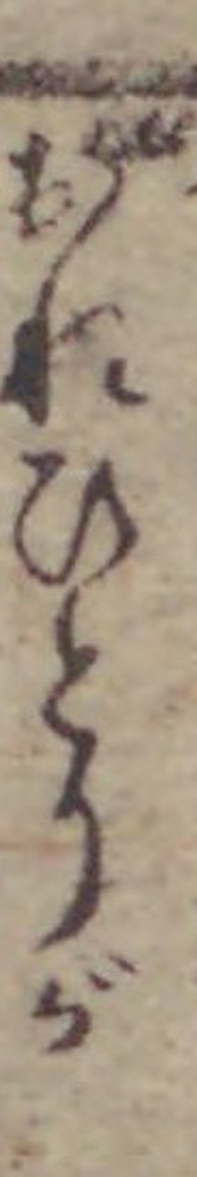おれひとりが
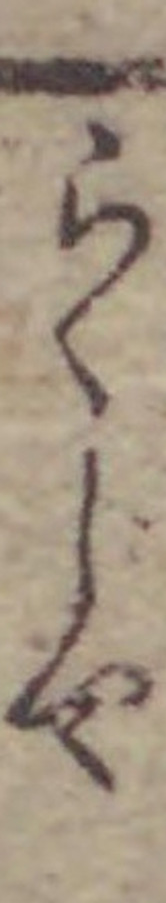らくじや
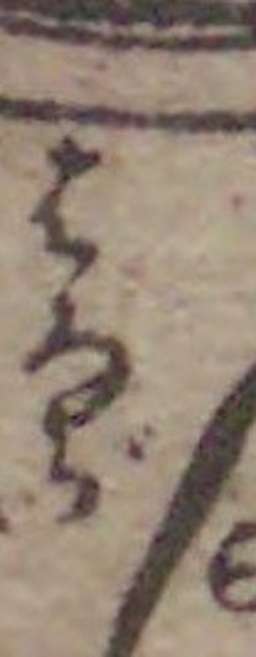はなが
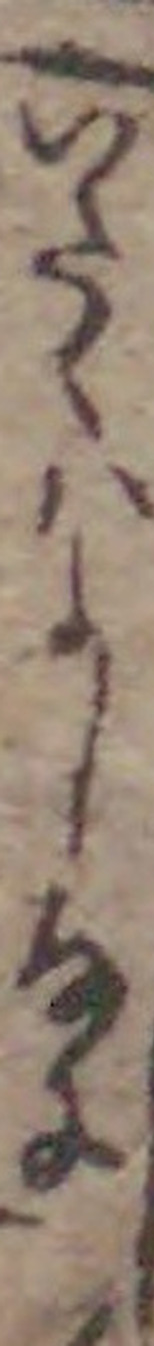いたくはよしなに
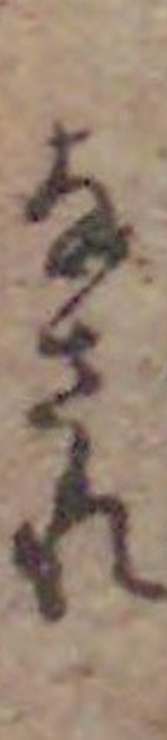なされ

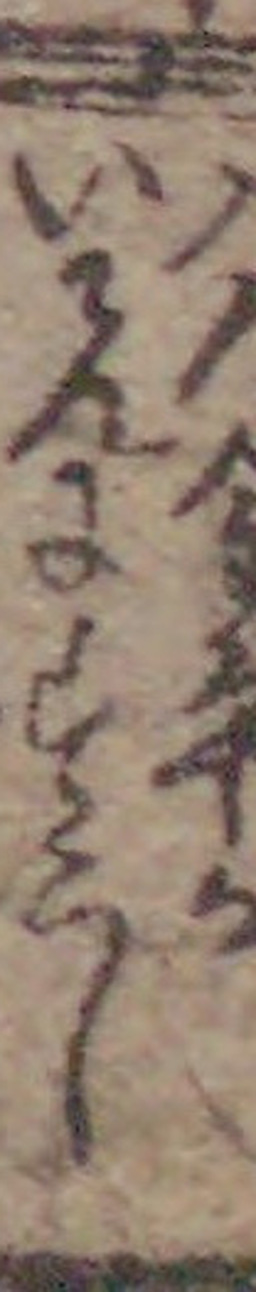いゑにすこし
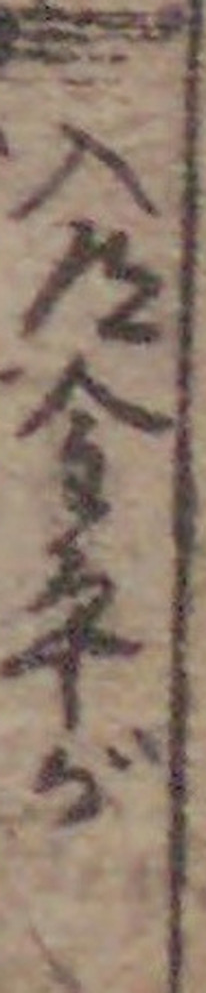入道金平が
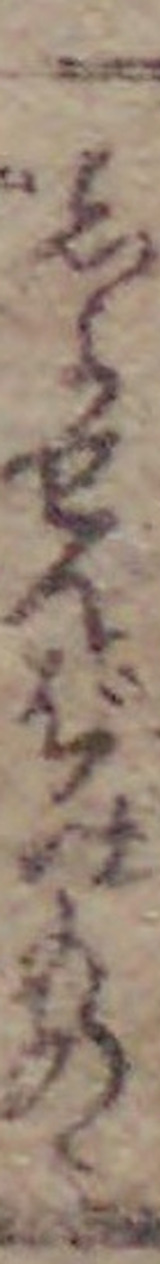しよせんばけものゝ
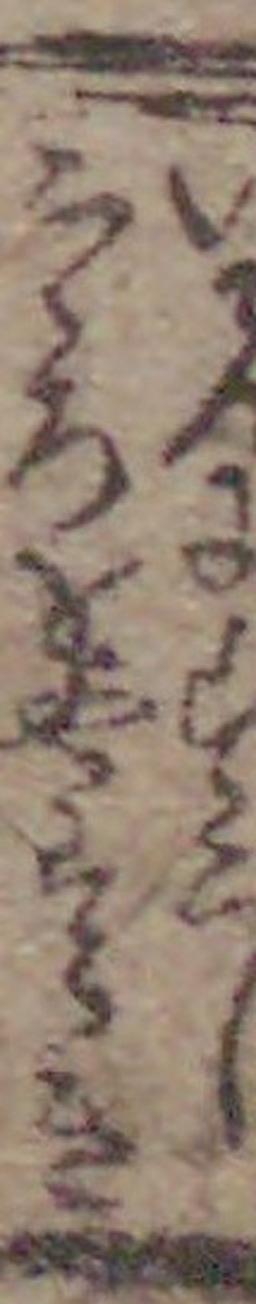こゝろをやわらき
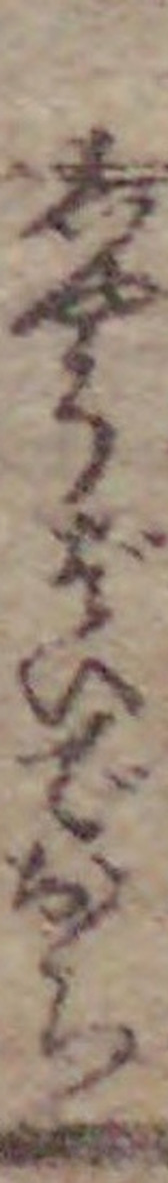しやうばいでおち
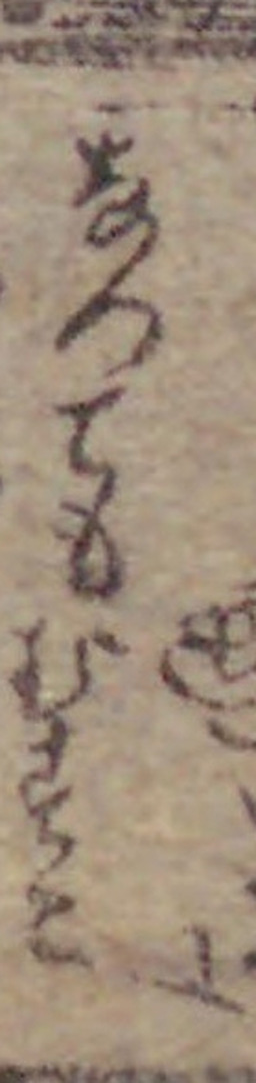なつてもむすこ
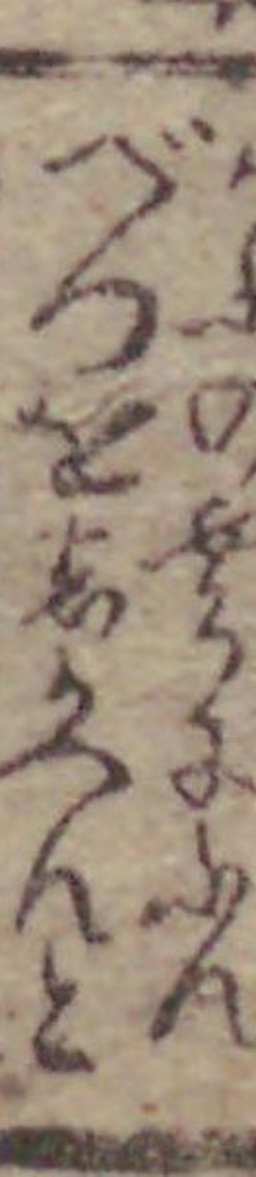べつをしかへんと
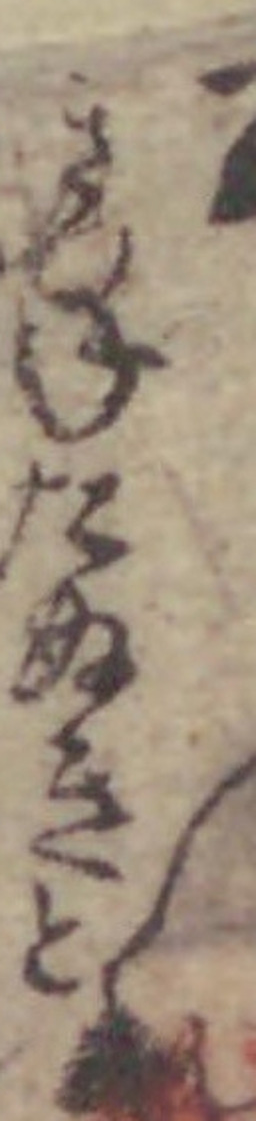きつねたぬきと
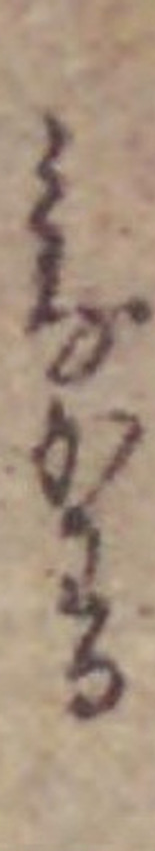みなかわる
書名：化物鼻がひしげ 2巻
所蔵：国立国会図書館 National Diet Library, JAPAN
